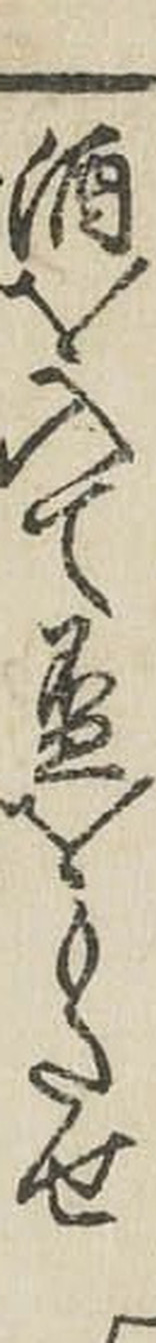酒を入て盃をもたせ
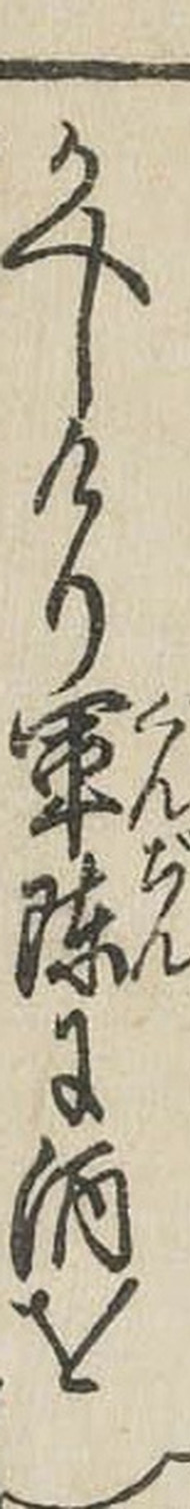かへしけり軍陣に酒を
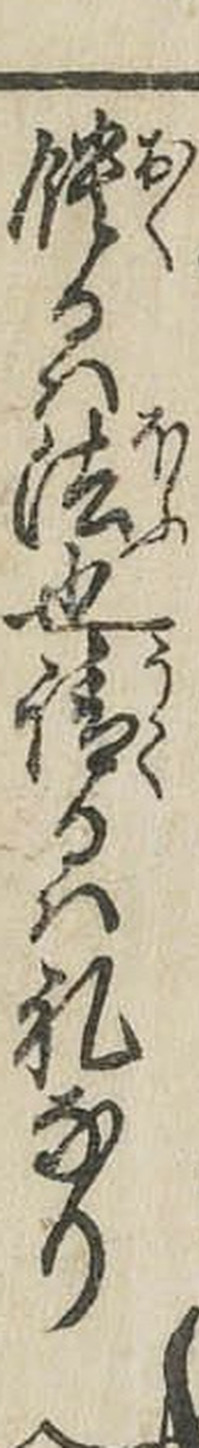饋るは法也請るは礼なり
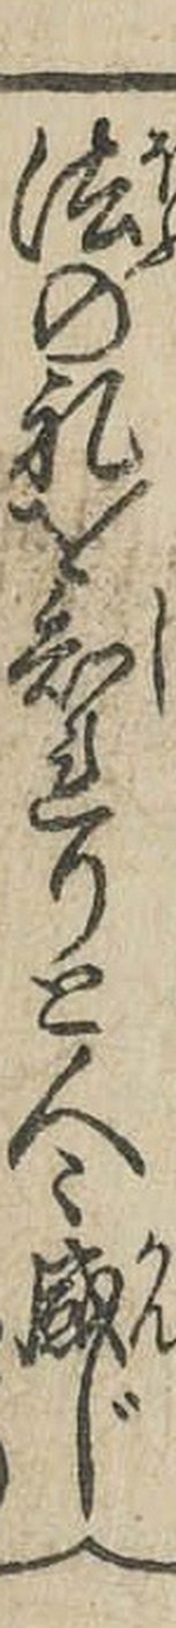法の礼を知れりと人々感じ
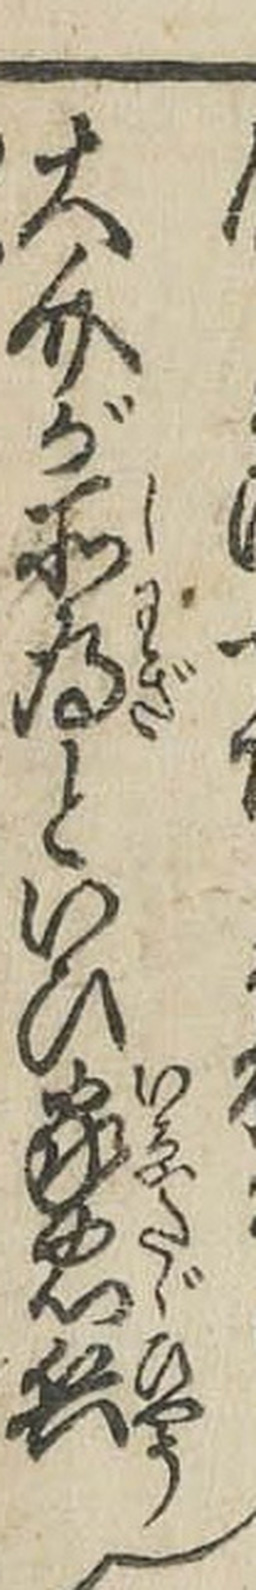大介が所為といひ家忠兵

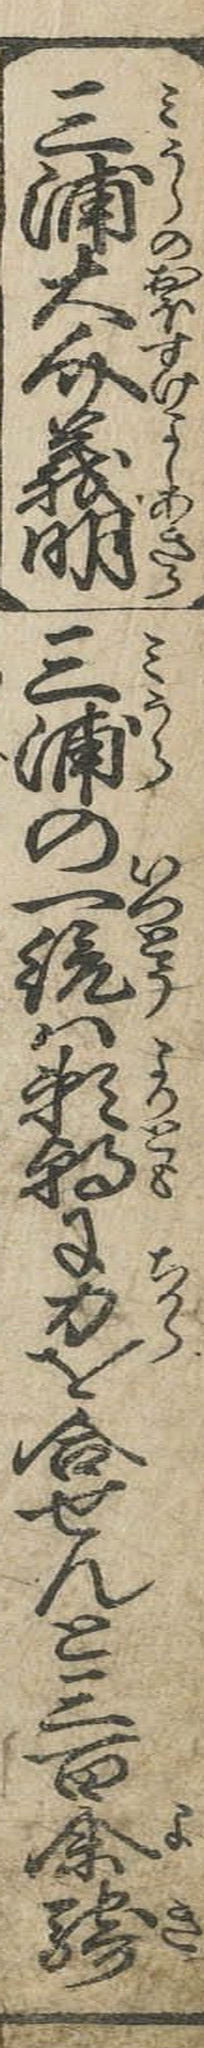三浦大介義明三浦の一統は頼朝に力を合せんと三百余騎
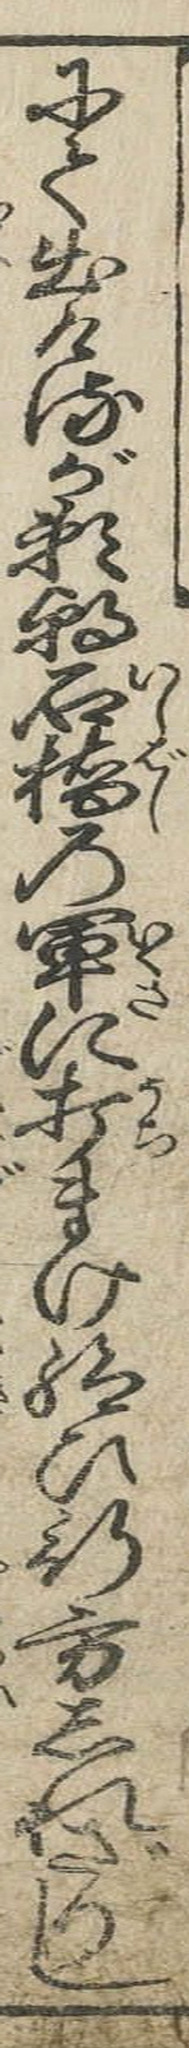にて出けるが頼朝石橋の軍に打まけ給ひ行方しれざりし
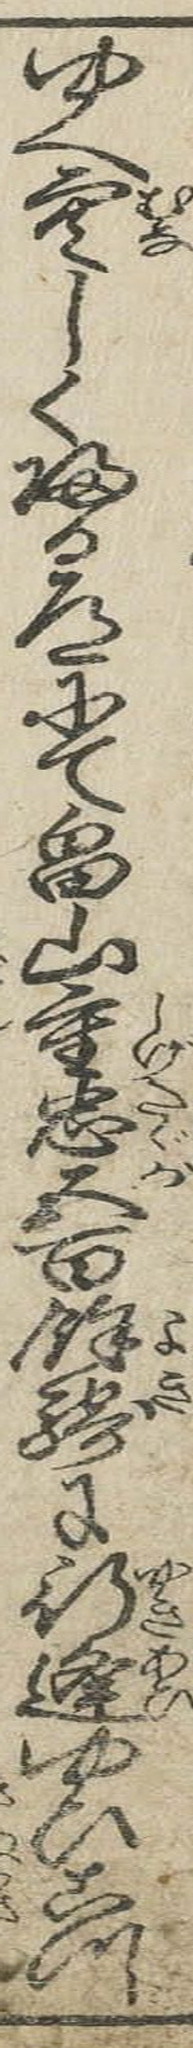ゆへ空しく帰る道にて畠山重忠五百余騎に行逢ゆひこつ
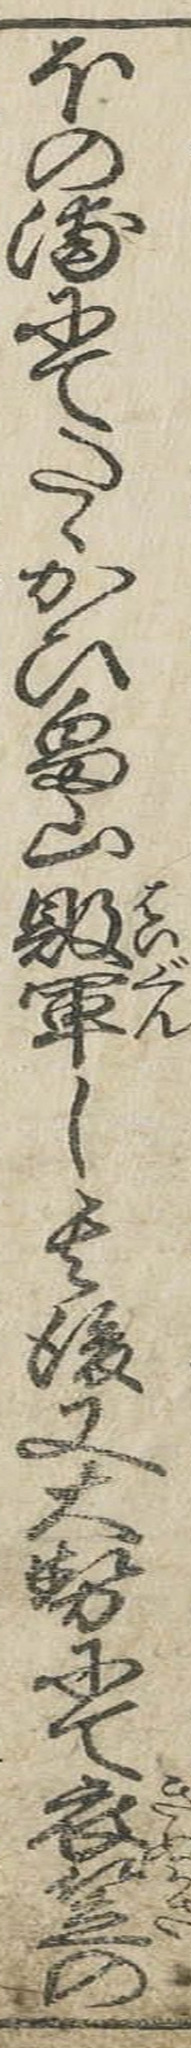ほの浦にてたゝかひ畠山敗軍し其後又大勢にて衣笠の
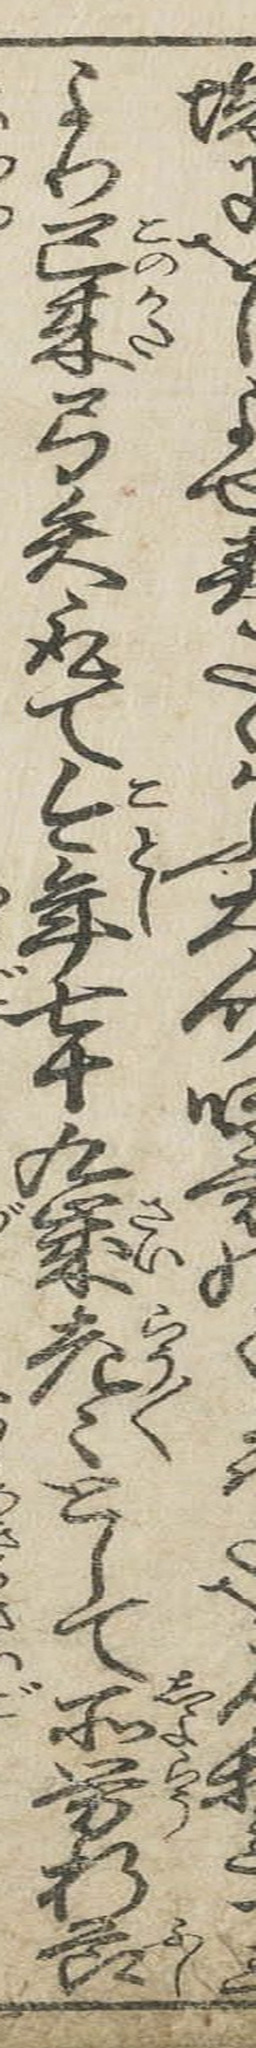より已来弓矢取て今年七十九歳老々として所労折節
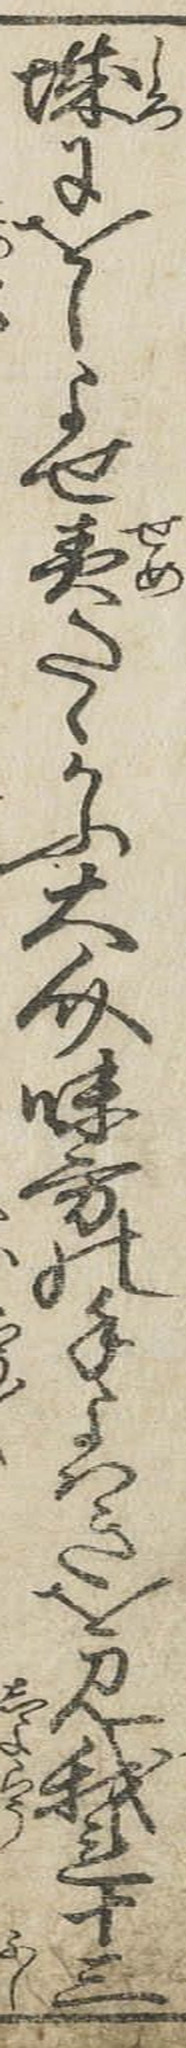城にをしよせ責たゝかふ大介味方の手よはきを見我れ十三
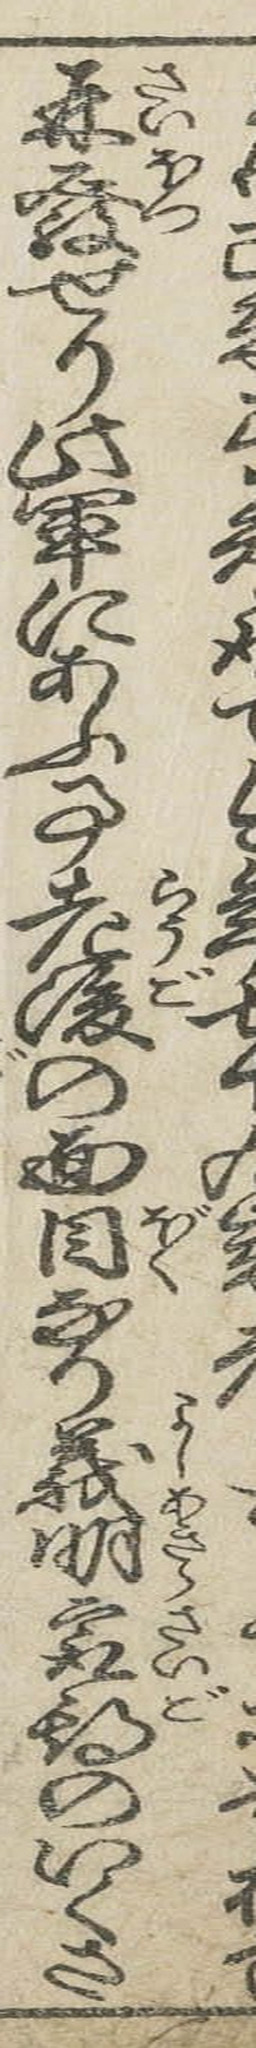再発せり此軍にあふ事老後の面目なり義明最期のいくさ
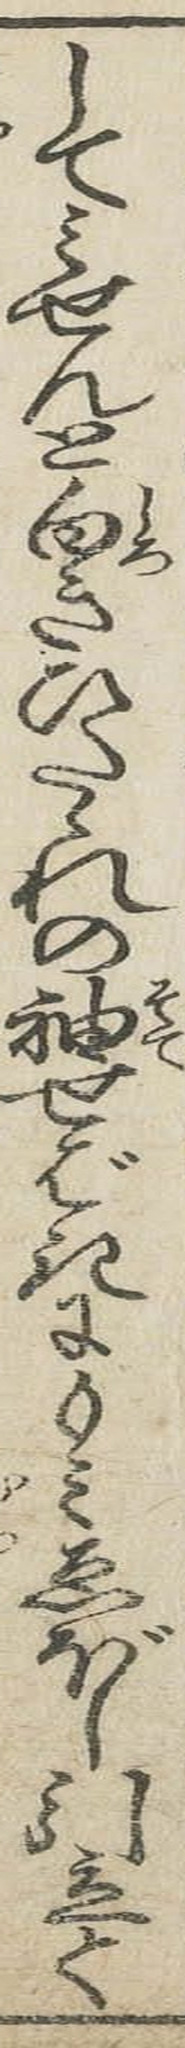してみせんと白きひたゝれの袖せばきにもみゑぼし引立て
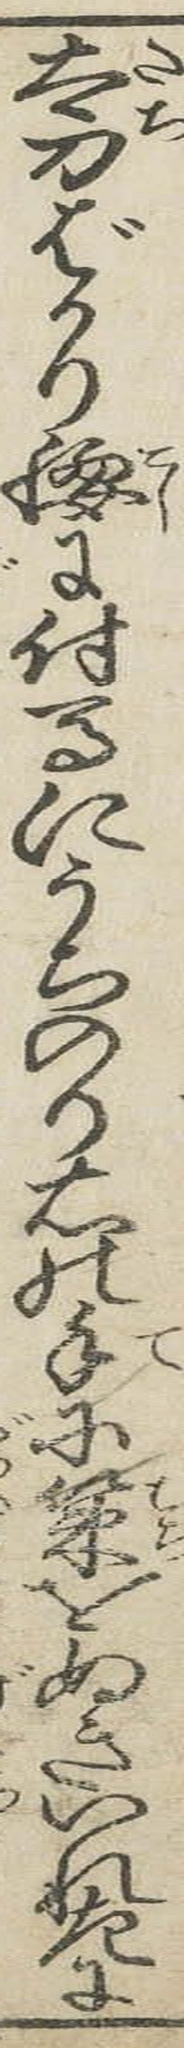太刀ばかり腰に付馬にうちのり右の手に策をぬきいれ左に
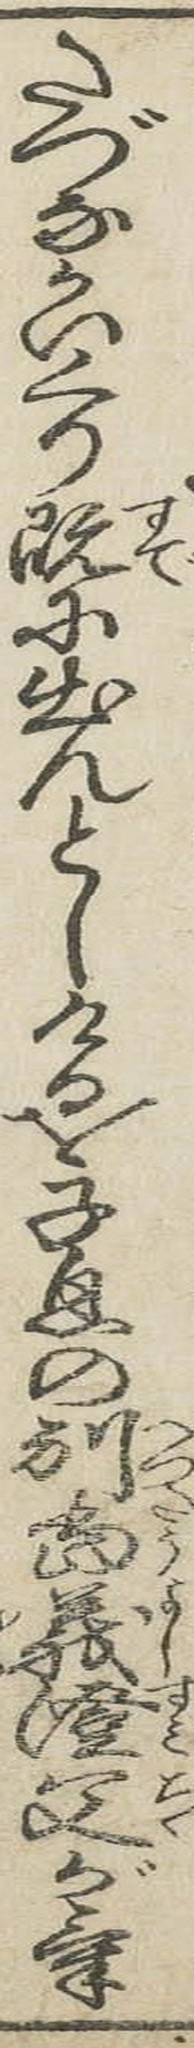たづなかいくり既に出んとしけるを子息の別当義澄父が気
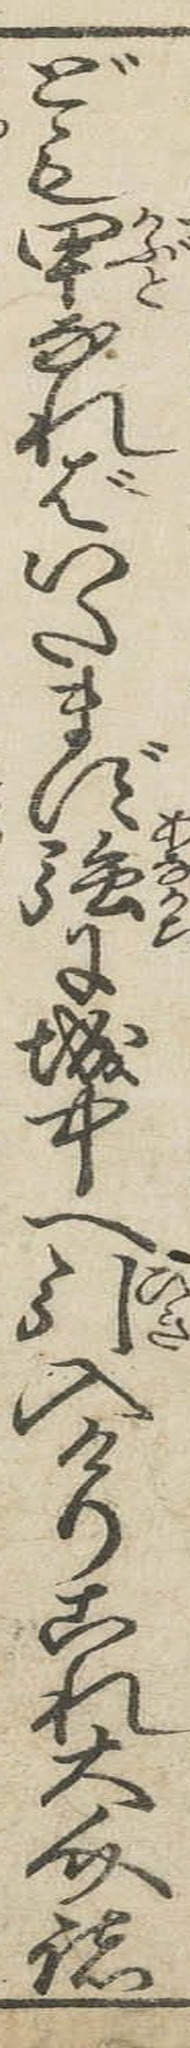ども甲なればいたまず強に城中へ引入けりこれ大介諸
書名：絵本写宝袋 9巻 3之巻
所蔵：東京学芸大学教育コンテンツアーカイブ
